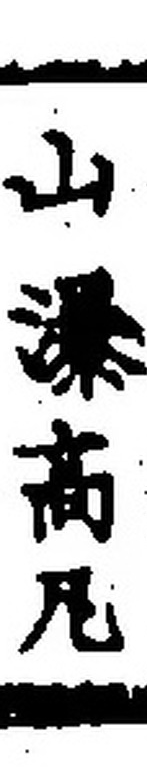山瀑高凡
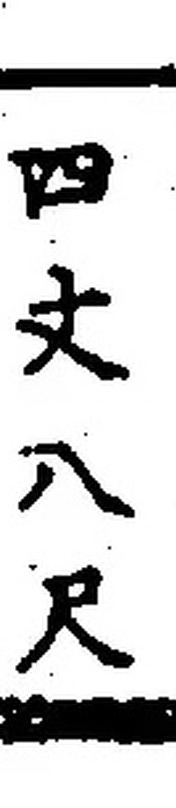四丈八尺
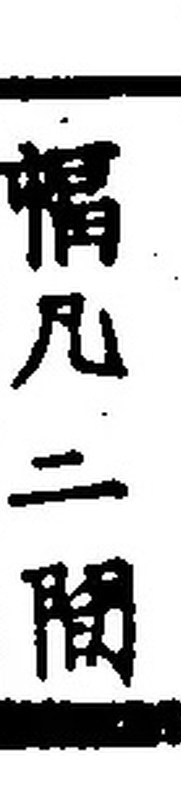幅凡二間
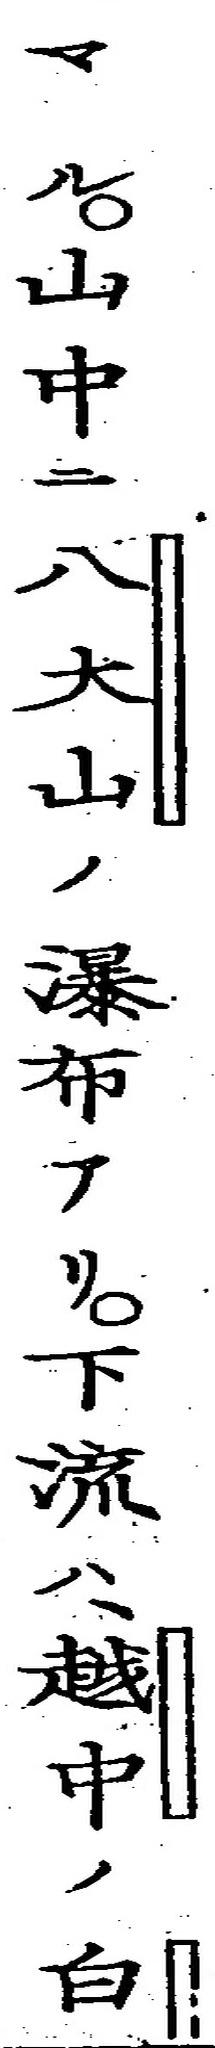マル。山中ニ八大山ノ瀑布アリ。下流ハ、越中ノ白
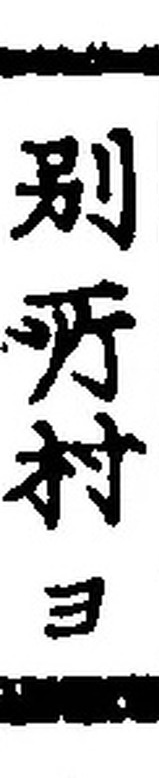別所村ヨ
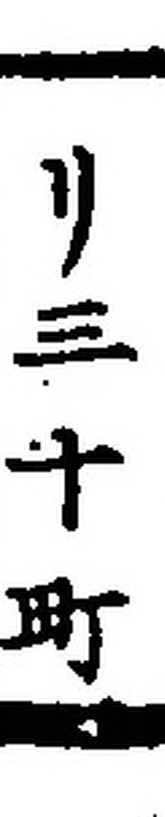リ三十町
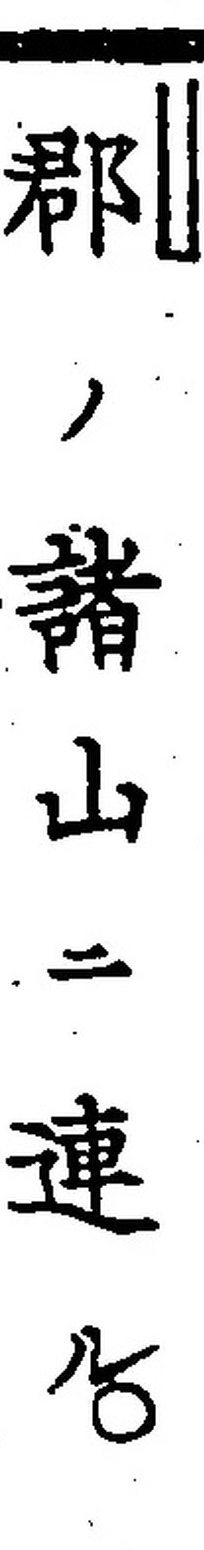郡ノ諸山ニ連ル。

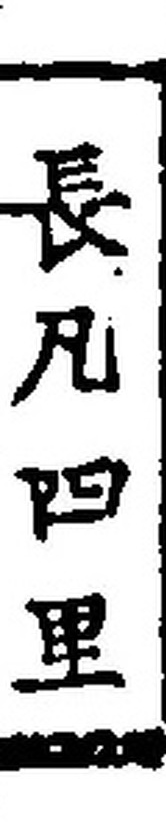長凡四里
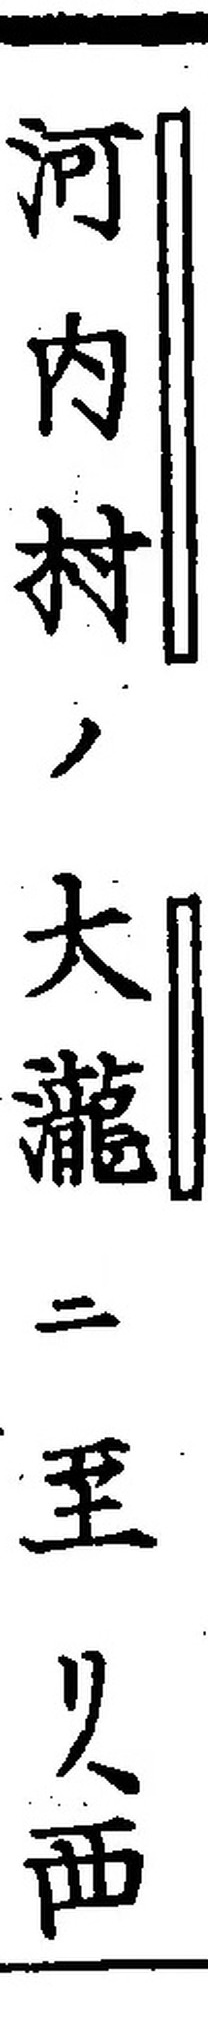河内村ノ大滝ニ至リ、西
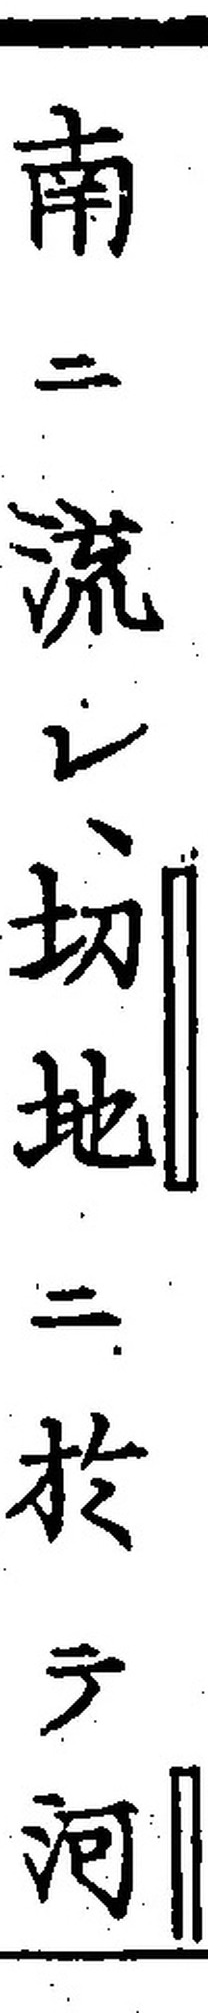南ニ流レ、切地ニ於テ河
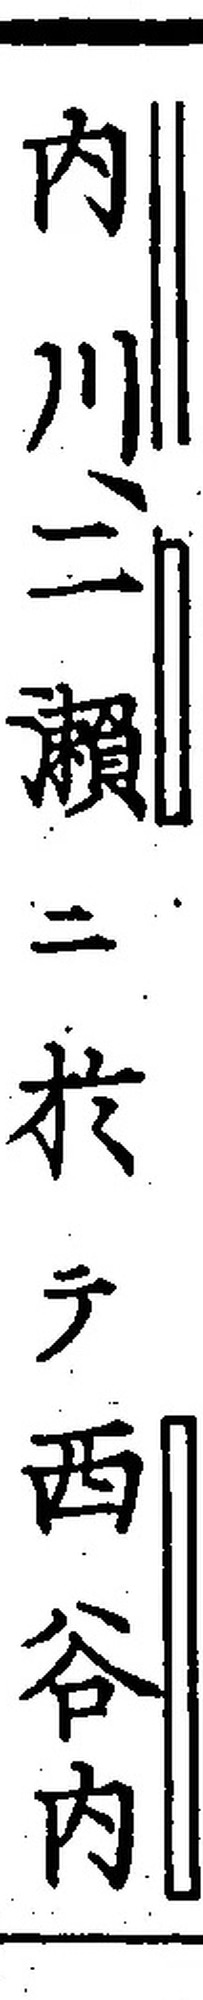内川、二瀬ニ於テ西谷内
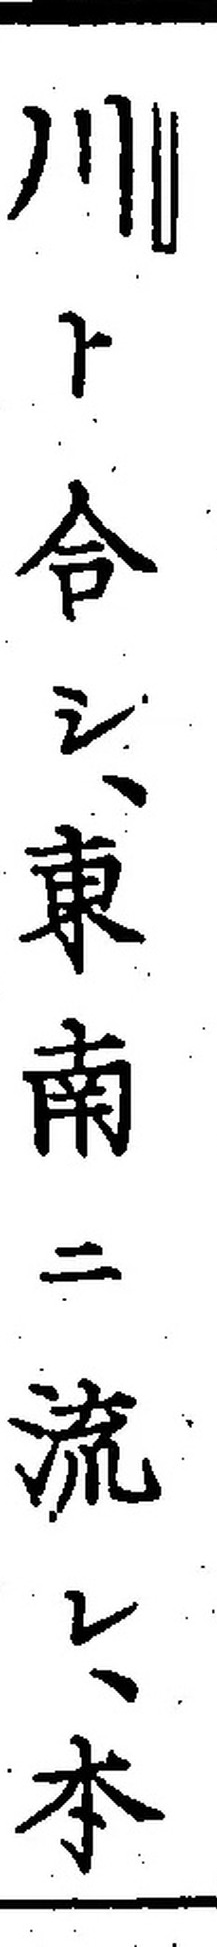川ト合シ、東南ニ流レ、本
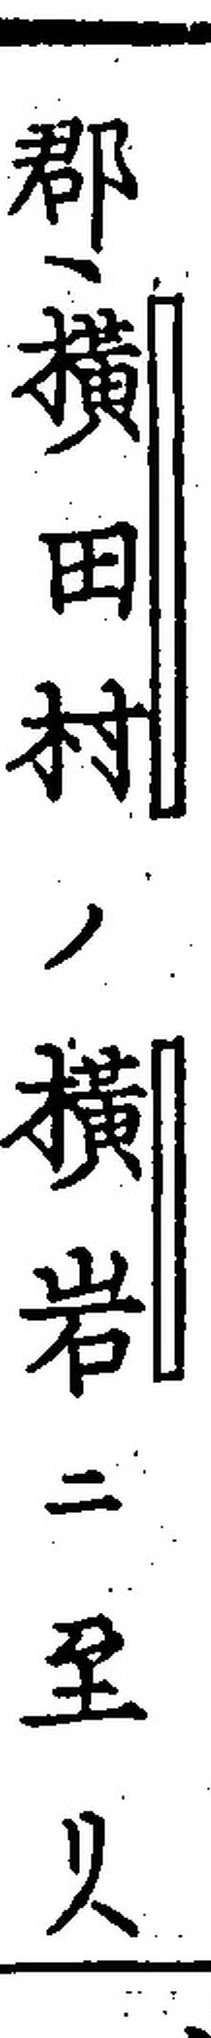郡・横田村ノ横岩ニ至リ、
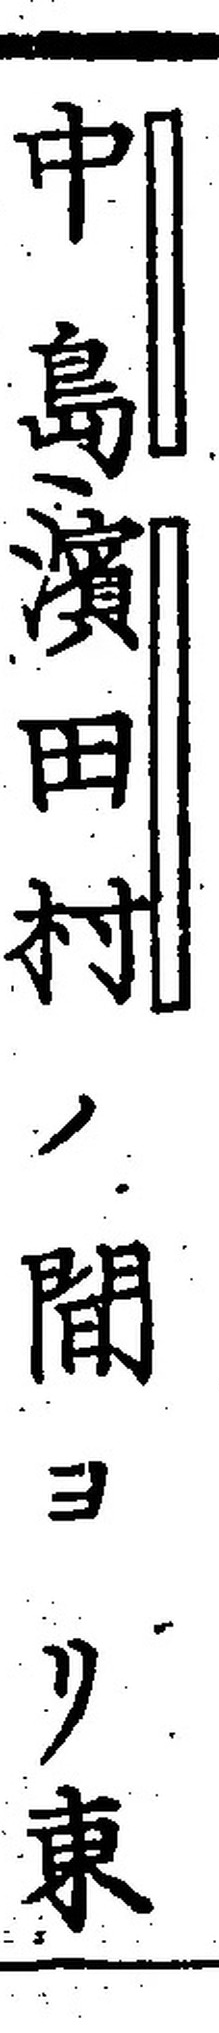中島・浜田村ノ間ヨリ東
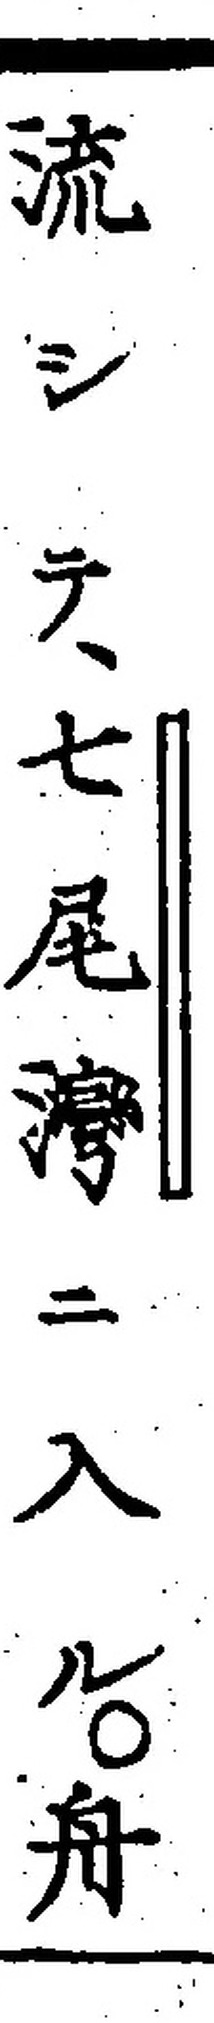流シテ、七尾湾ニ入ル。舟
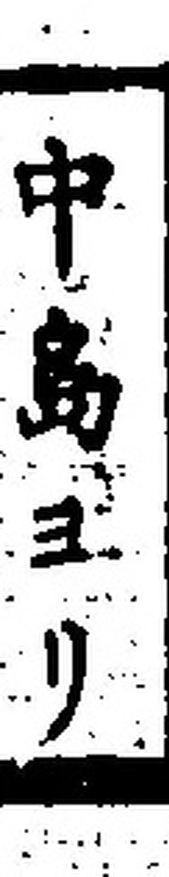中島ヨリ
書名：能登地誌略
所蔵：国立国会図書館 National Diet Library, JAPAN
